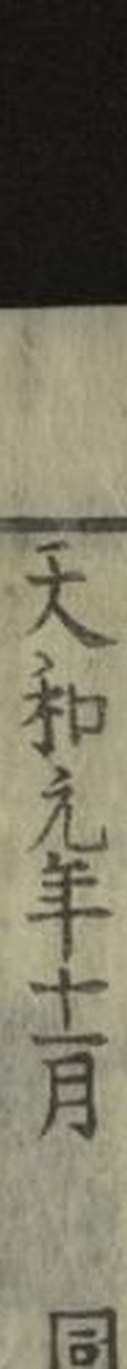天和元年十一月同
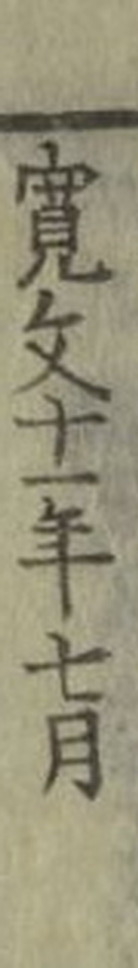寛文十一年七月同
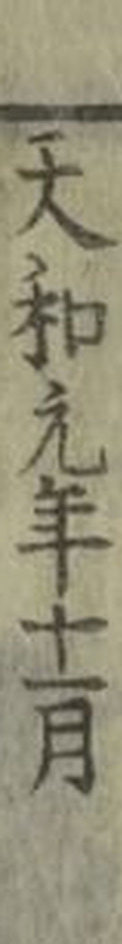天和元年十一月同
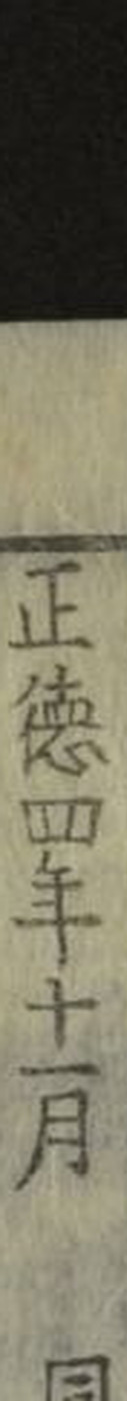正徳四年十一月同
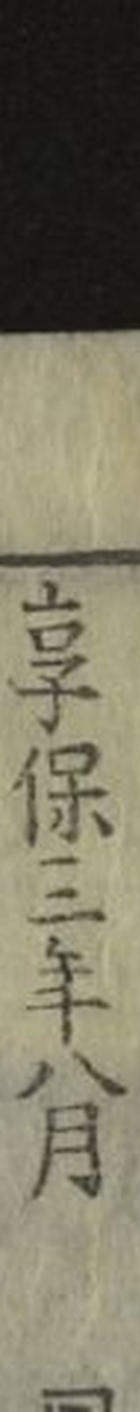享保三年八月同
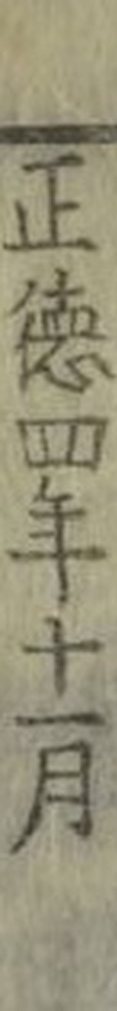正徳四年十一月同
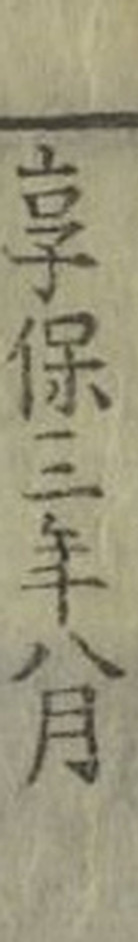享保三年八月同
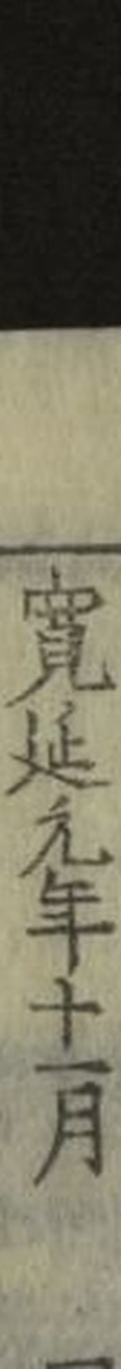寛延元年十一月同
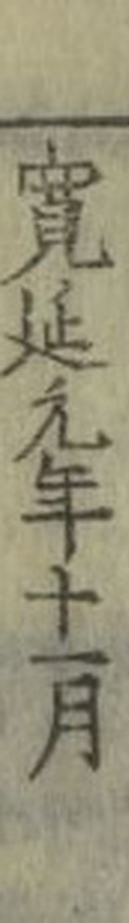寛延元年十一月同
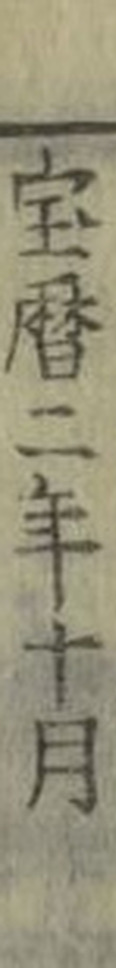宝暦二年十月同
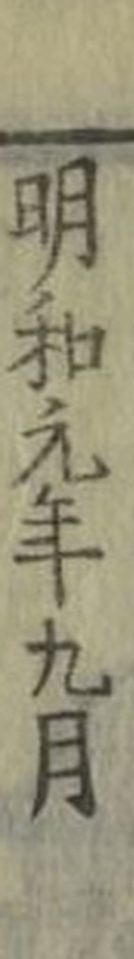明和元年九月同
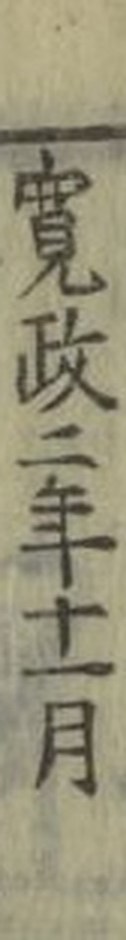寛政二年十一月同
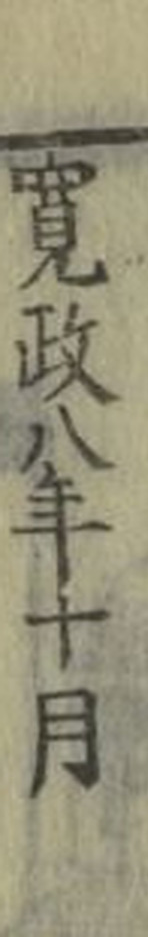寛政八年十月同
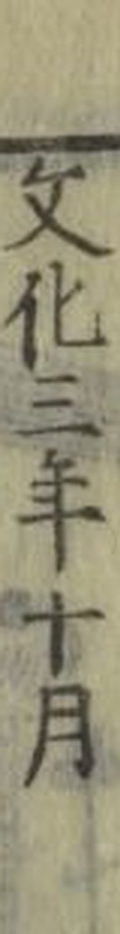文化三年十月同
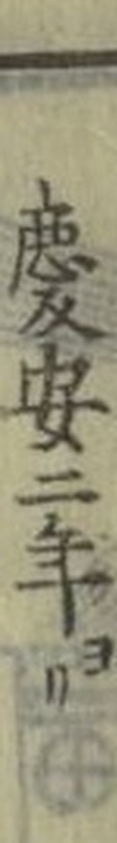慶安二年ヨリ
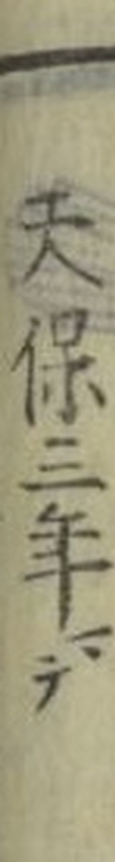天保三年マテ
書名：琉球人行列記
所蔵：University of the Ryukyus Library
